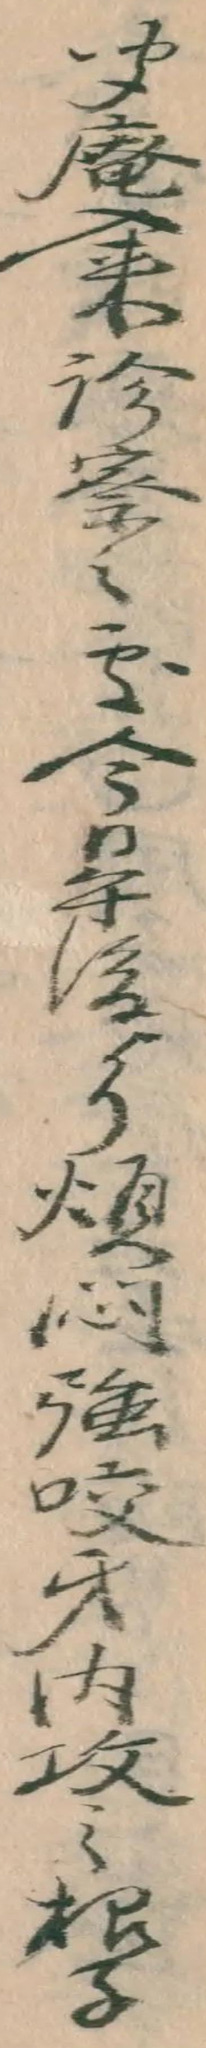聞庵入来診察之處今日午後より煩悶強咬牙内攻之様子
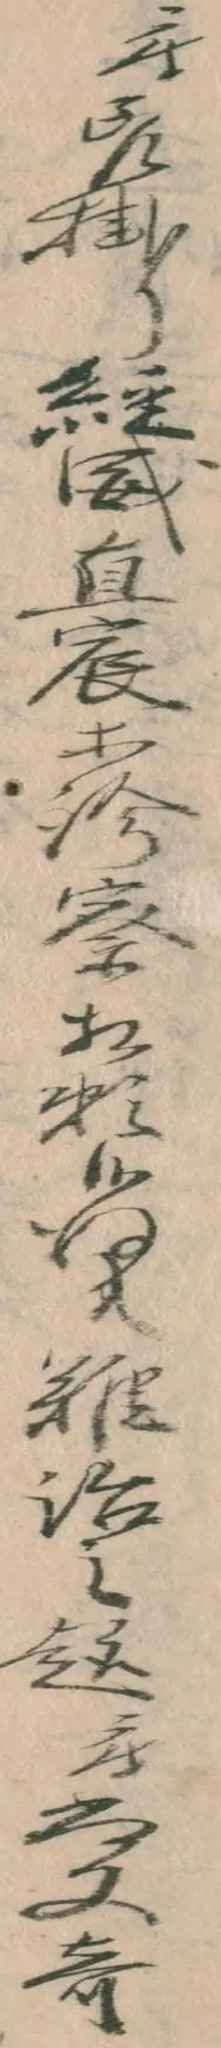ニ付差掛り経威直宸等診察相頼候得共難治之趣ニ付尚又奇
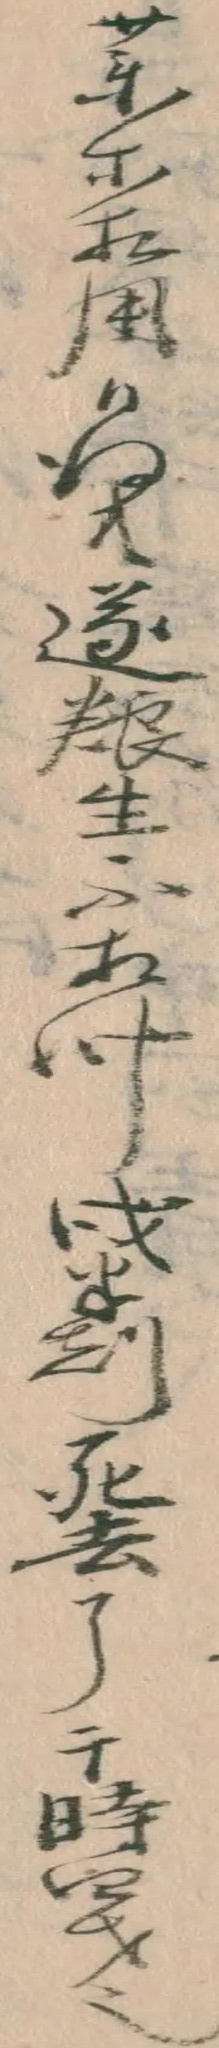薬等相用候得共遂養生不相叶戌半刻死去了于時四才也
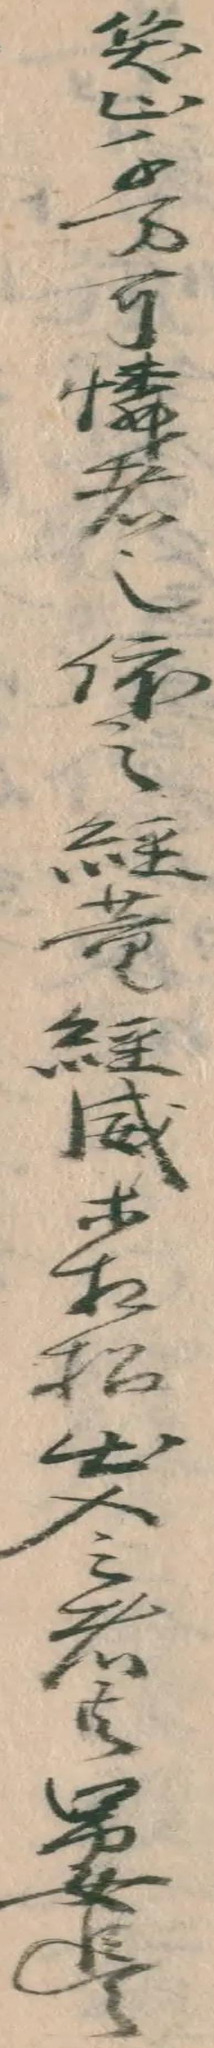笑止千万可憐者也依之経董経威等相招出入之者共男女追々
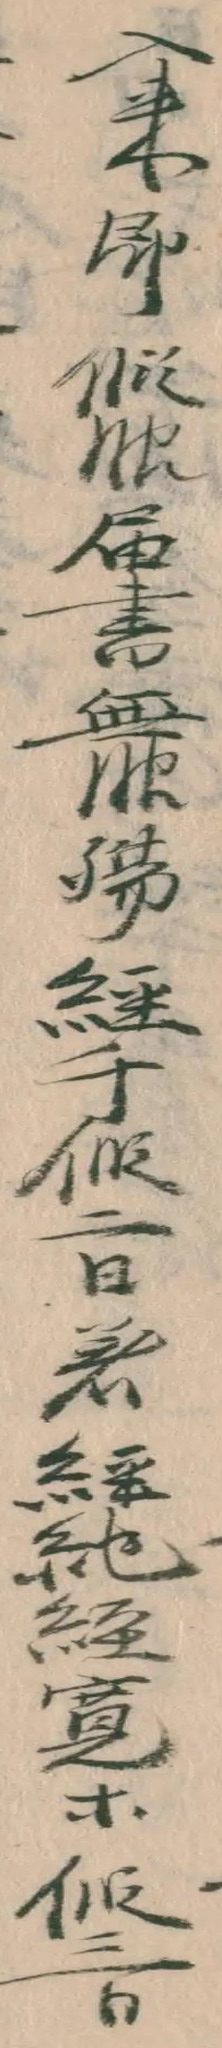入来即假服届書無服経千假二日着経紀経寛等假三日
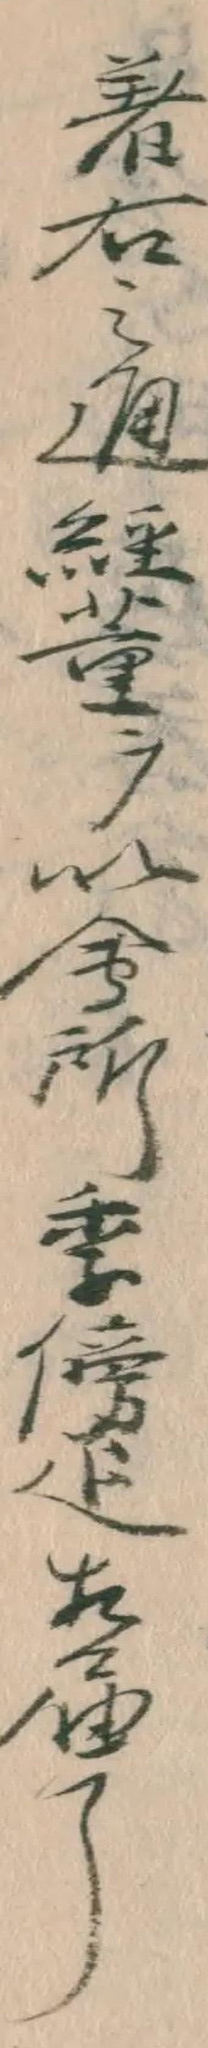着右之通経董ヲ以會所季傍迄相届了
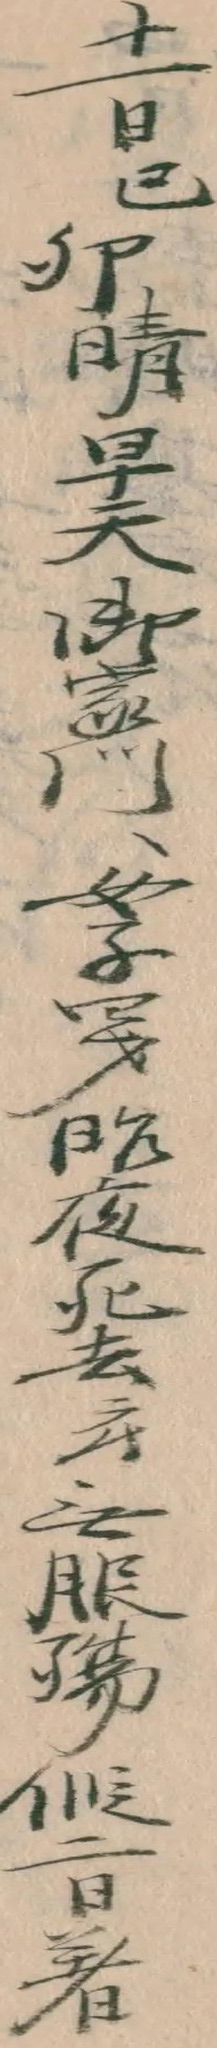十一日己卯晴早天御家門へ女子四才昨夜死去ニ付無服假二日着
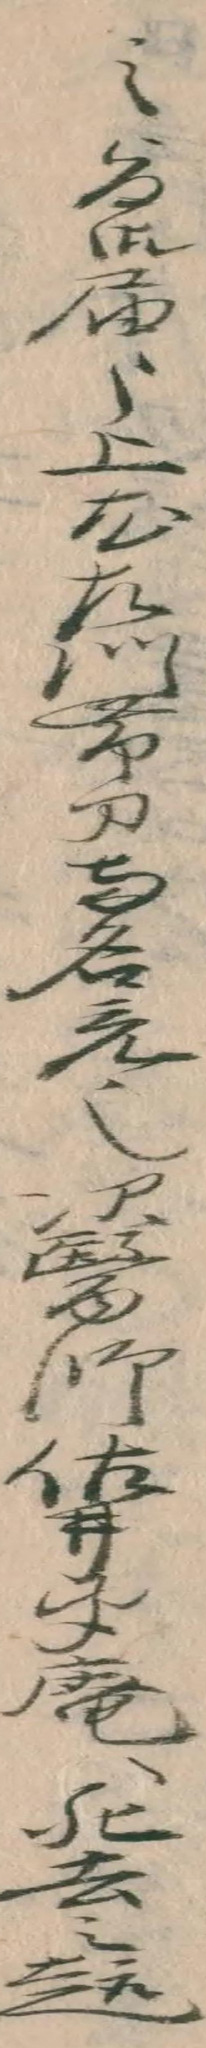之旨御届申上尤左門帯刀両名充也次醫師佐井聞庵へ死去之趣
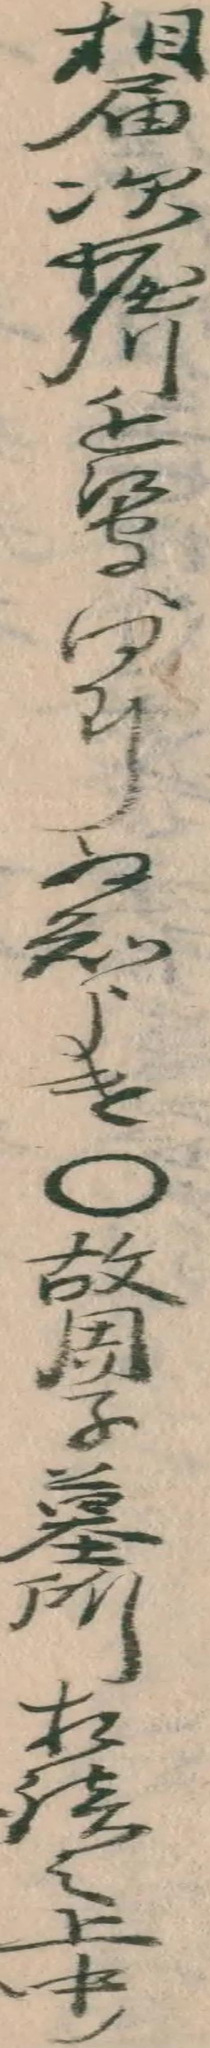相届次堀川近江守へ同断為知申遣〇故周子墓所相談之上中ノ
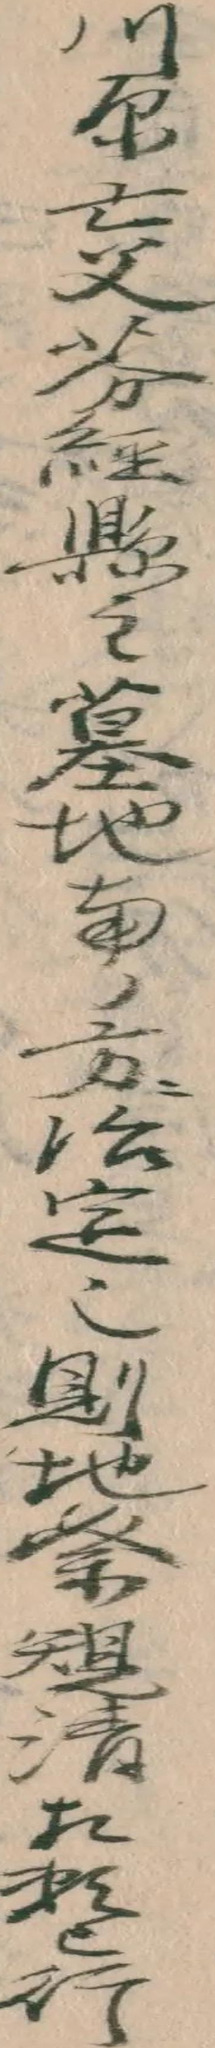川原亡父芬経縣主墓地南ノ方ニ治定也則地祭規清相頼被行
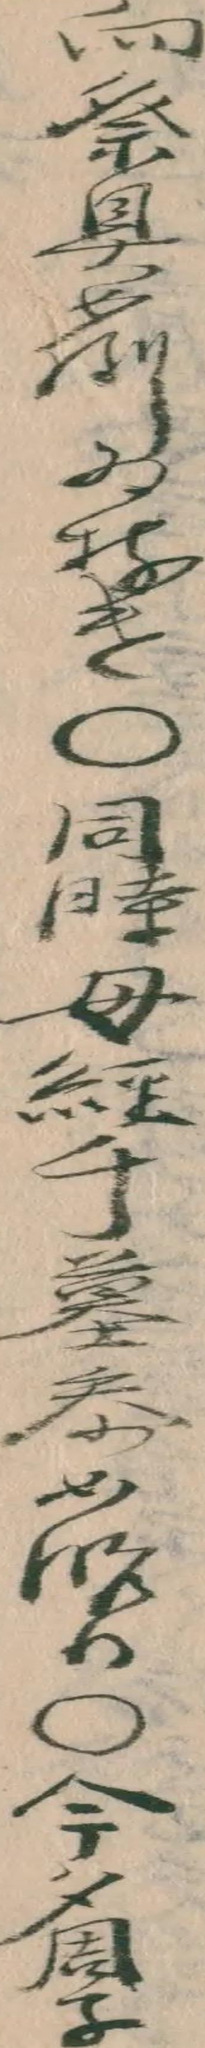向祭具如例為持遣○同時母経千墓参如昨日〇今夕周子
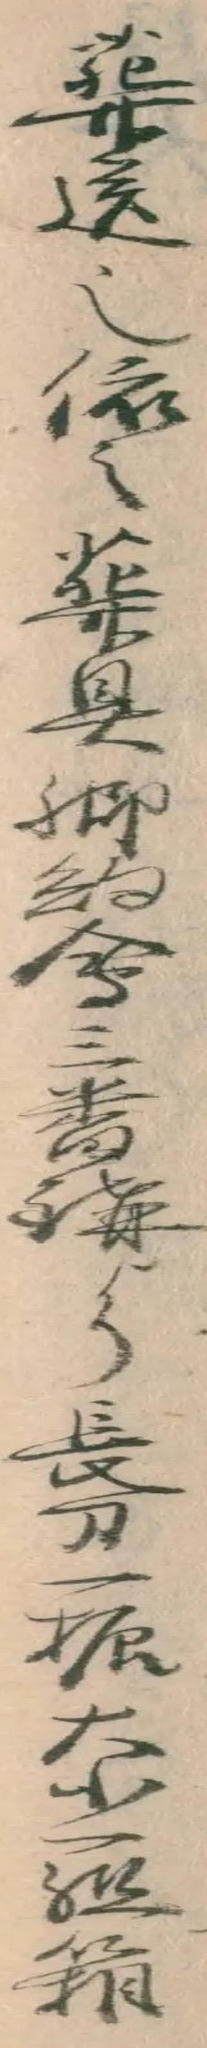葬送也依之葬具郷約會三番講より長刀一振大小一組箱
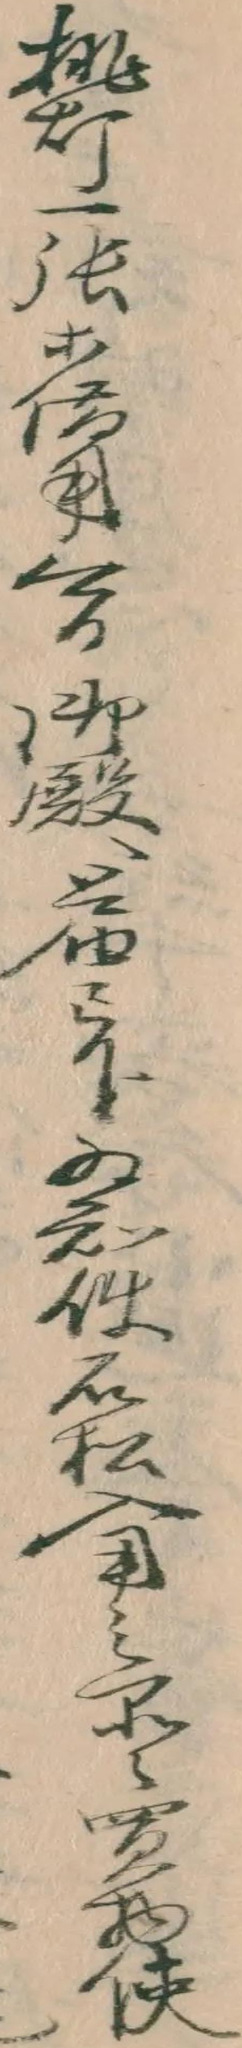挑灯一張等借用今日御殿へ御届被下為知使石松入用之品々買物使
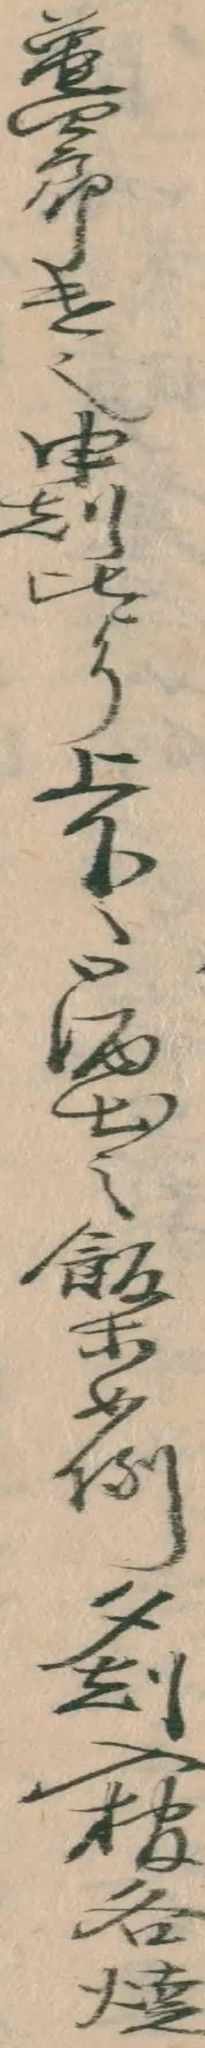曽四郎遣也申刻頃より上下へ御酒出之飯等如例夕刻入棺各焼
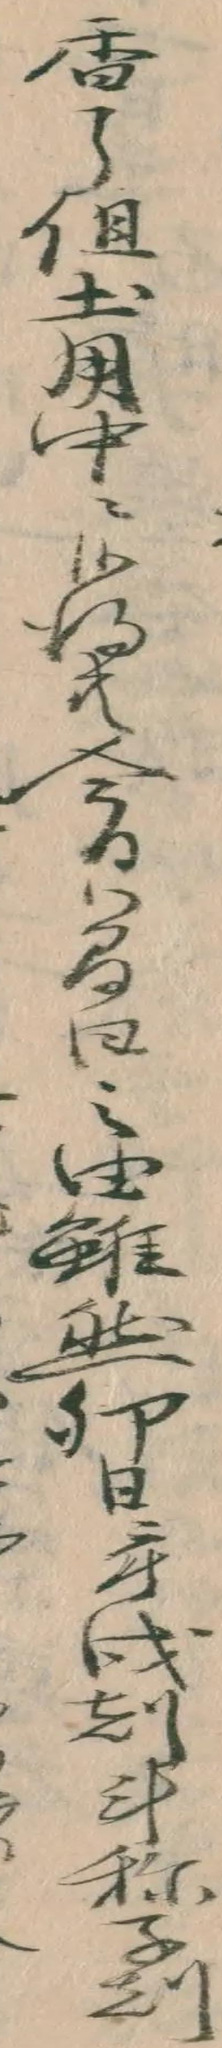香了但土用中に候得共今日は間日之由雖然卯日ニ付戌刻斗称子刻
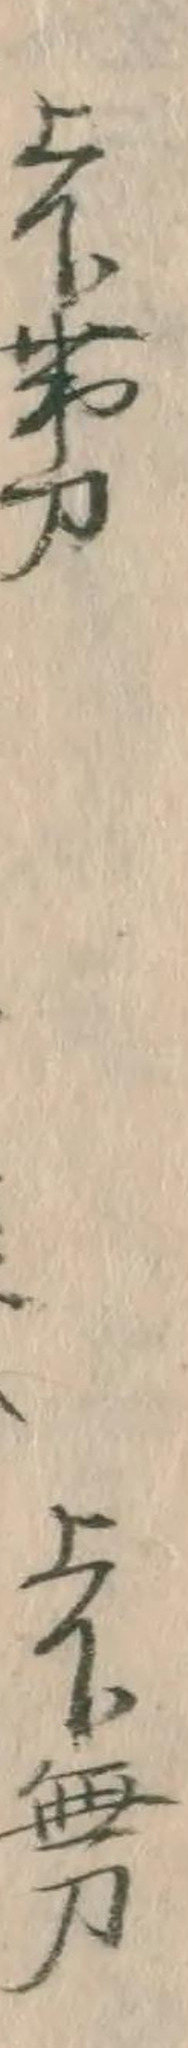上下無刀上下無刀
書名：賀茂社記録. 第65冊
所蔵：国立国会図書館 National Diet Library, JAPAN
